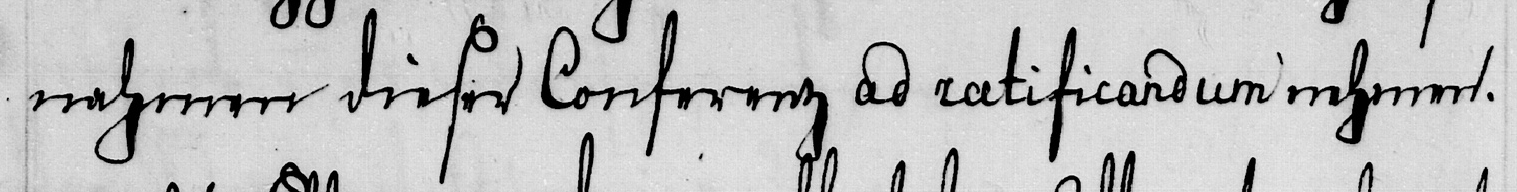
nahmen dieser Conferenz ad ratificandum nehmen.
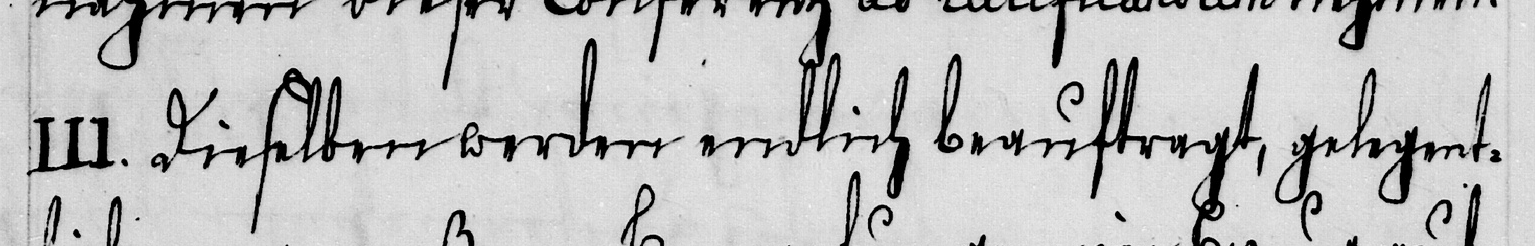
II. Dieselben werden endlich beauftragt, gelegent¬
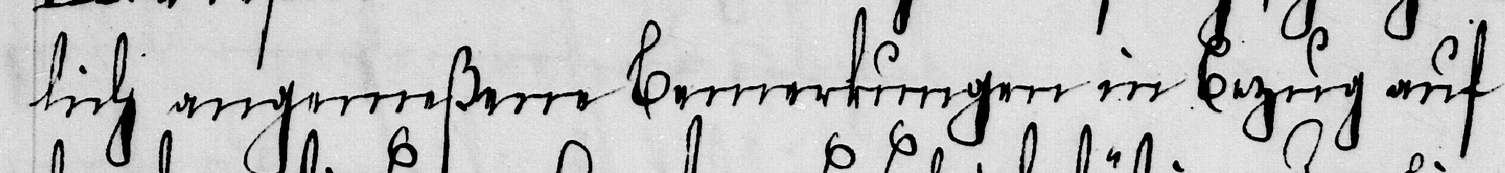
lich angemeßene Bemerkungen in Bezug auf
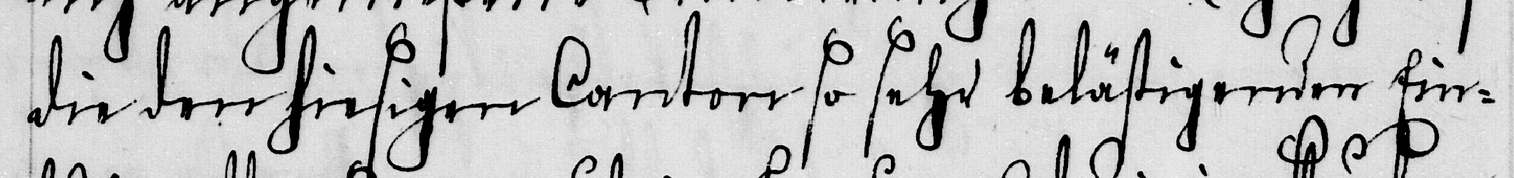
die den hiesigen Canton so sehr belästigenden Ein¬
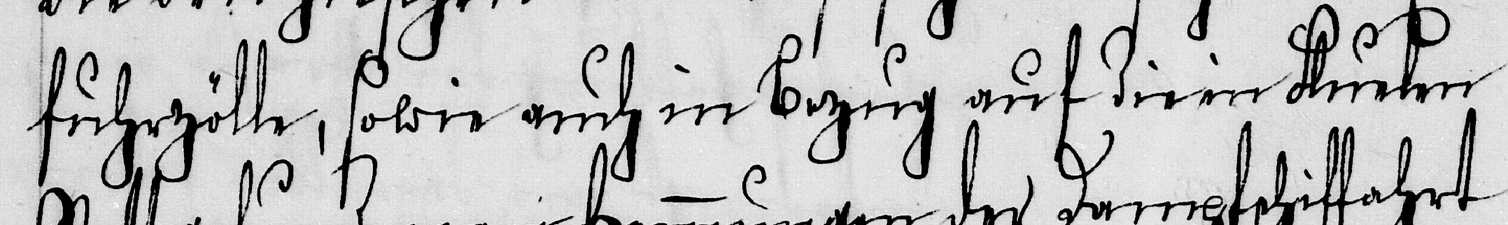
fuhrzölle, sowie auch in Bezug auf die in Fluelen
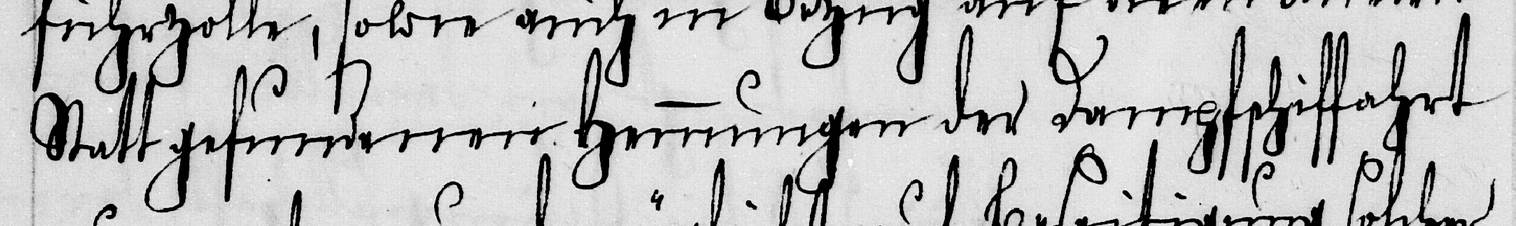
Statt gefundenen Hemmungen der Dampfschiffahrt
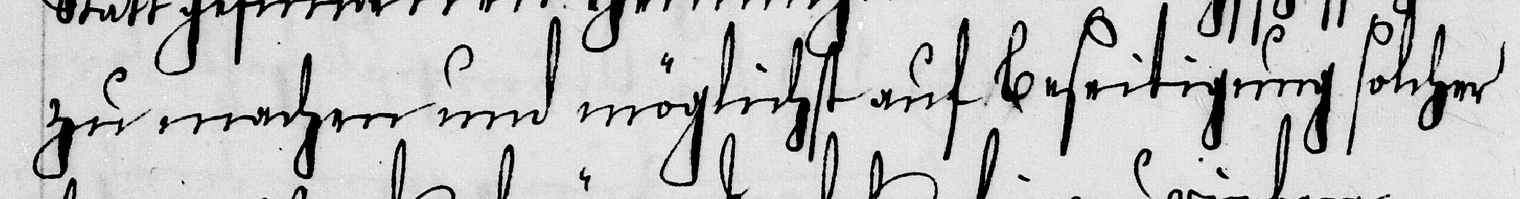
zu machen und möglichst auf Beseitigung solcher
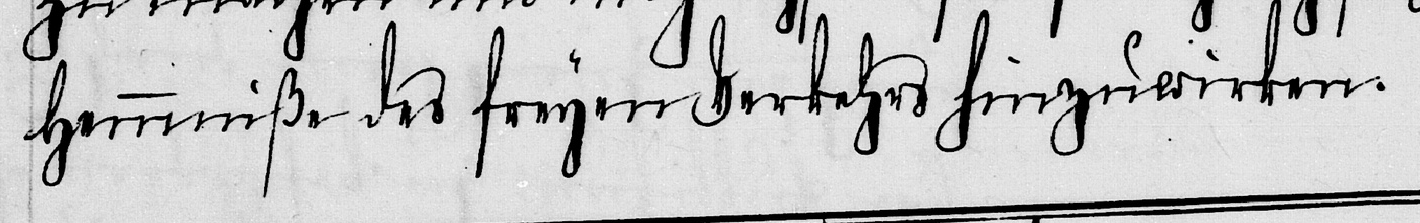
Hemmniße des freyen Verkehrs hinzuwirken.
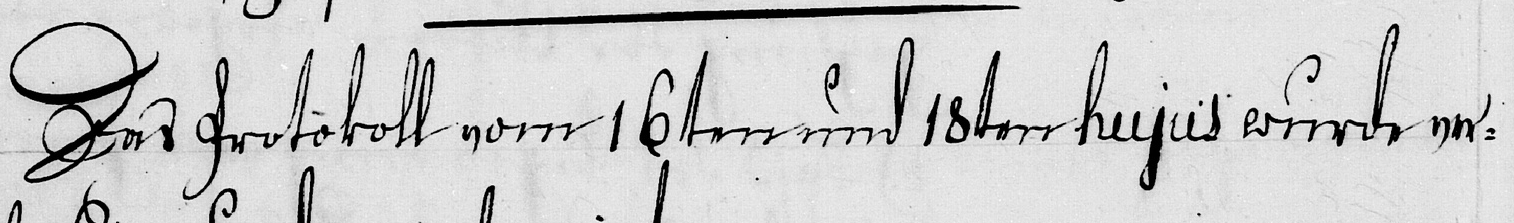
Das Protokoll vom 16ten und 18ten hujus wurde ve¬
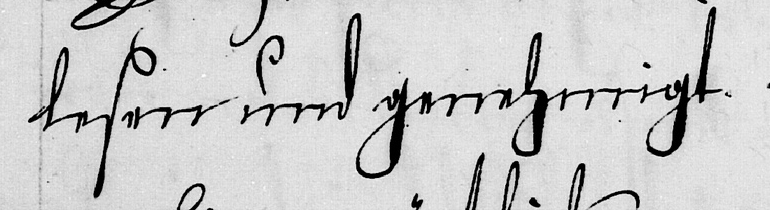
rlesen und genehmigt.
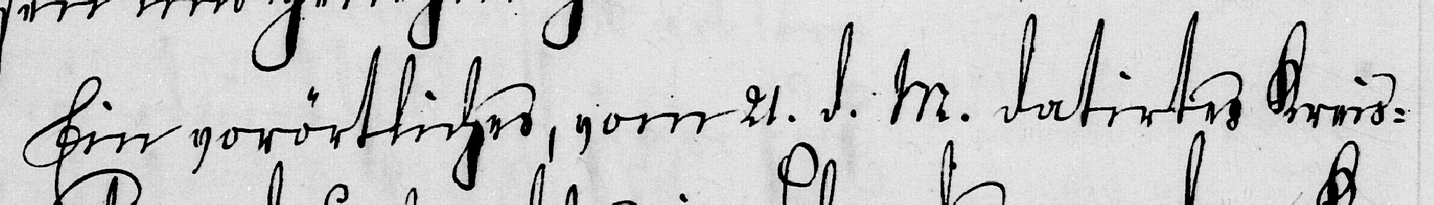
Ein vorörtliches, vom 21. d. M. datirtes Kreis¬
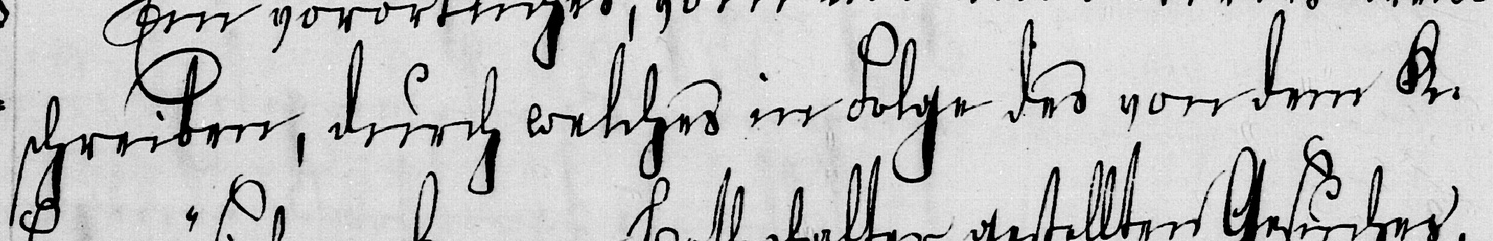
schreiben, durch welches in Folge des von dem K.
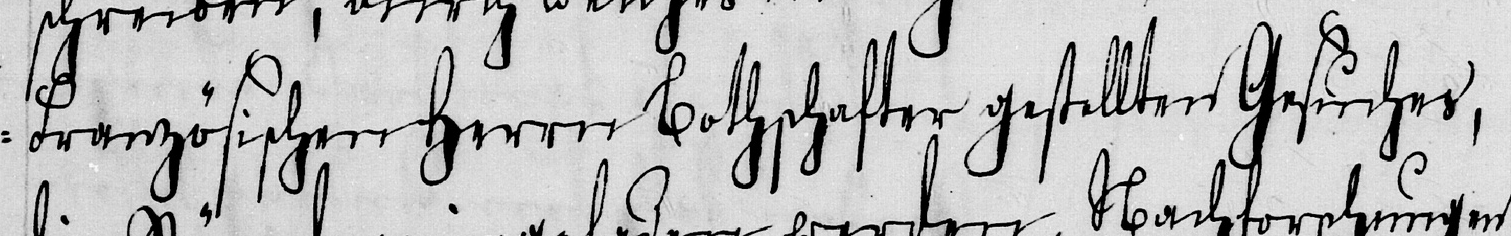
Französischen Herrn Botschafter gestellten Gesuches,
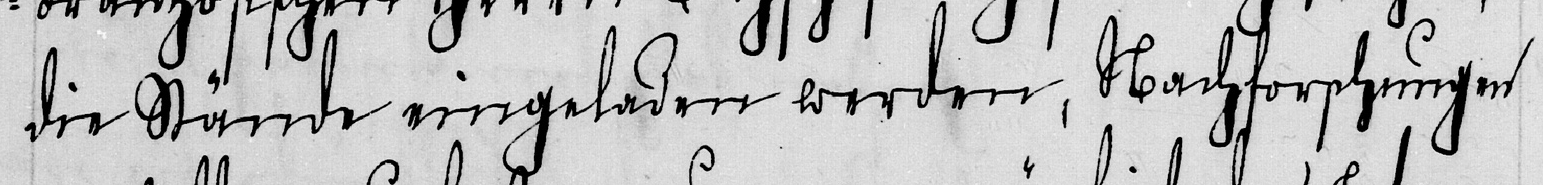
die Stände eingeladen werden, Nachforschungen
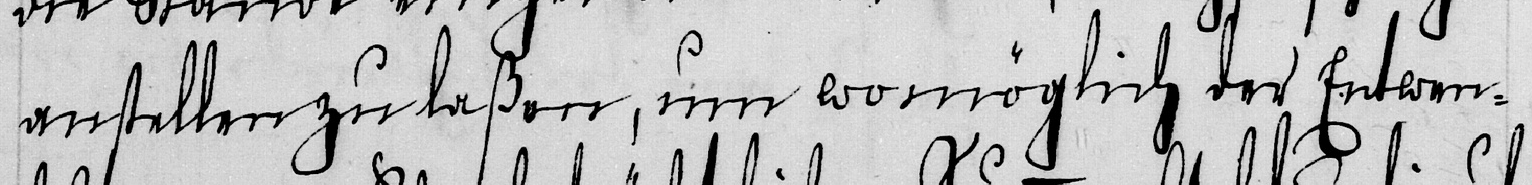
anstellen zu laßen, um womöglich der Entwen¬
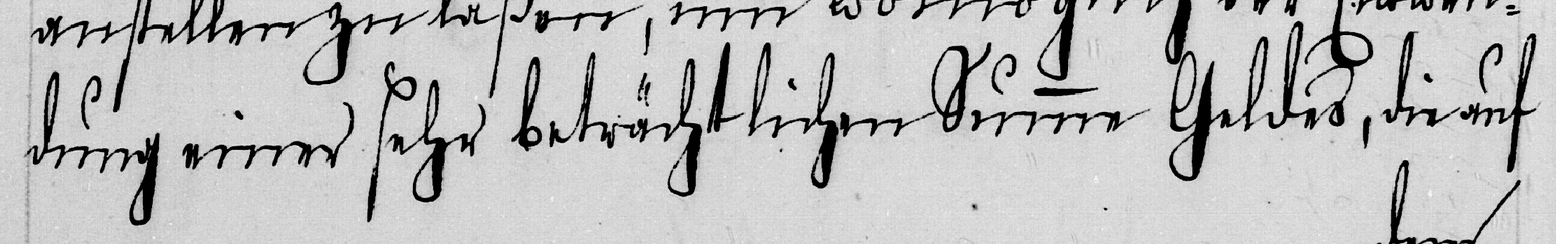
dung einer sehr beträchtlichen Summe Geldes, die
